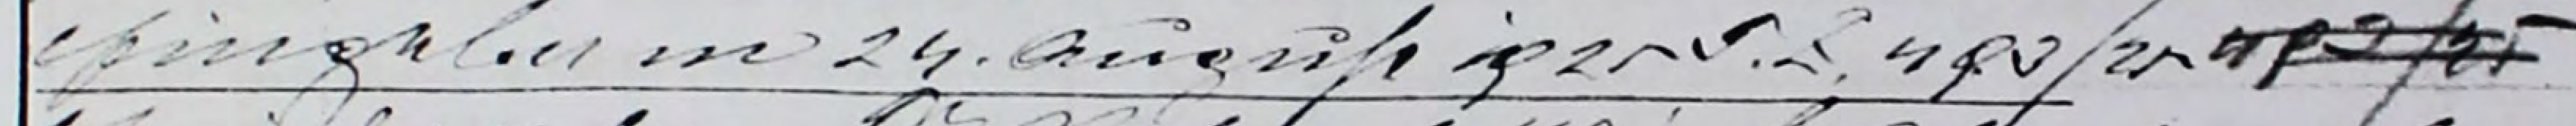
Eingelen in 24. August 1925 T.Z. 493/25 493/25
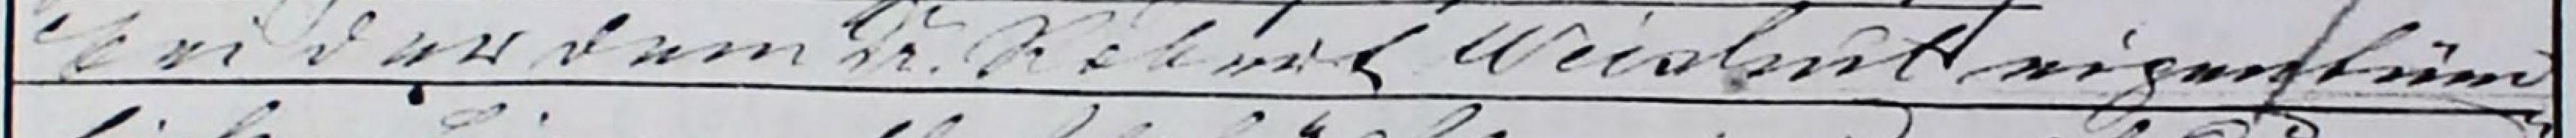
Bei der dem Dr. Robert Weishut eigentüm„
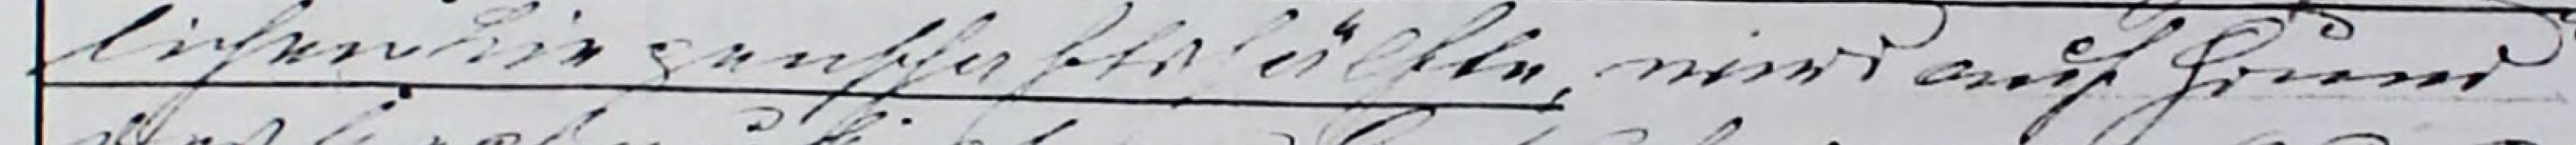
lichen Liegenschaftshälfte, wird auf Grund
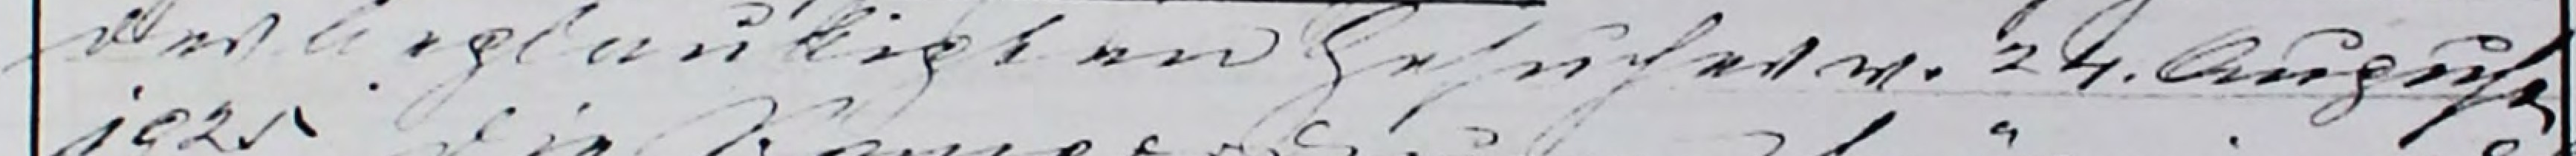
des beglaubigten Gesuches v. 24. August
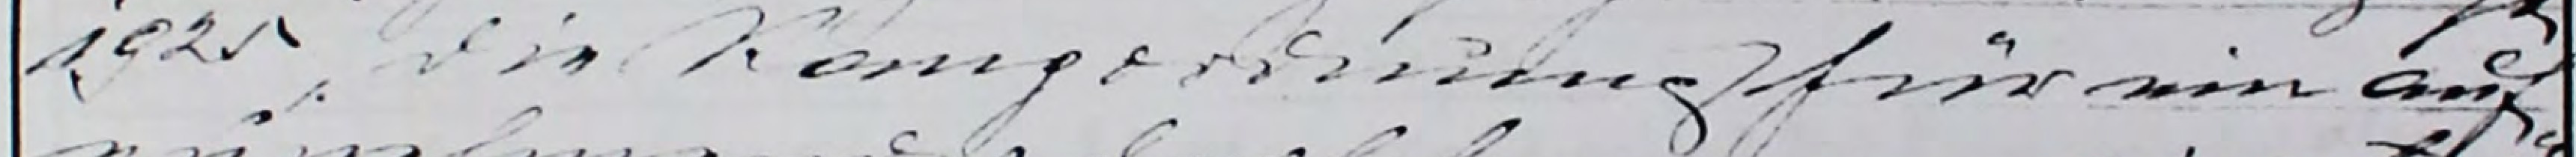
1925, die Rangordnung für ein auf
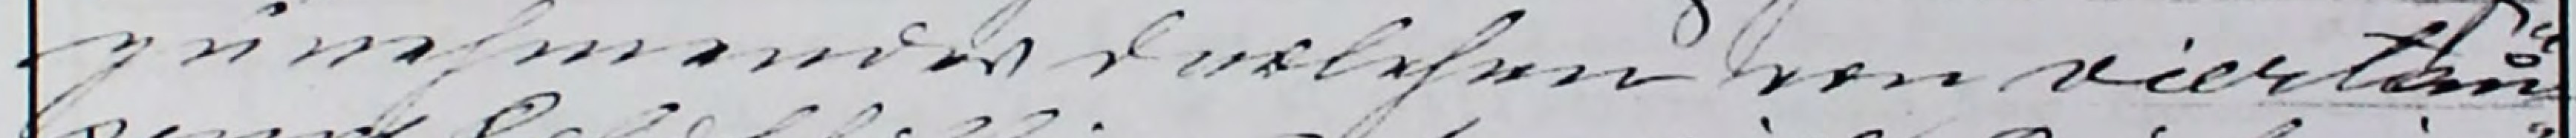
zunehmendes Darlehen von viertaus„
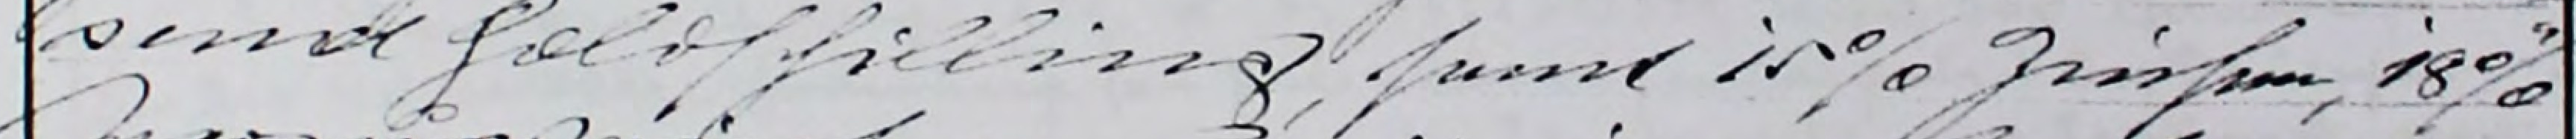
end Goldschilling, samt 15 % Zinsen, 18 %
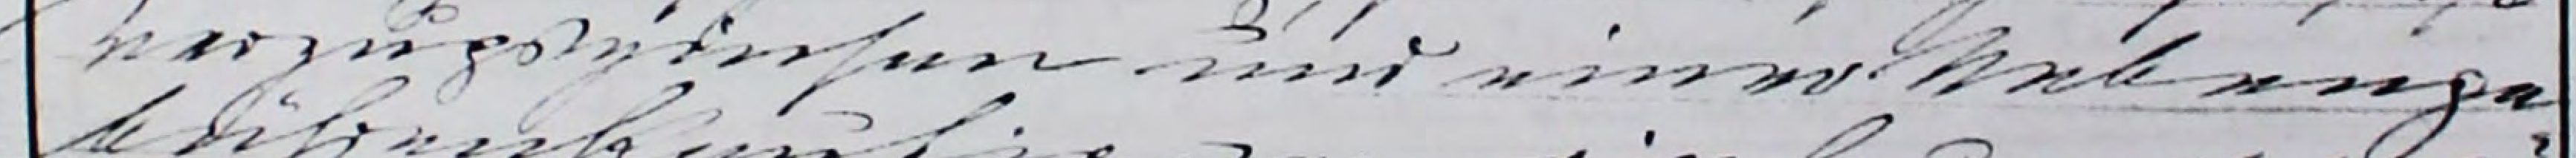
Verzugszinsen und einer Nebenge
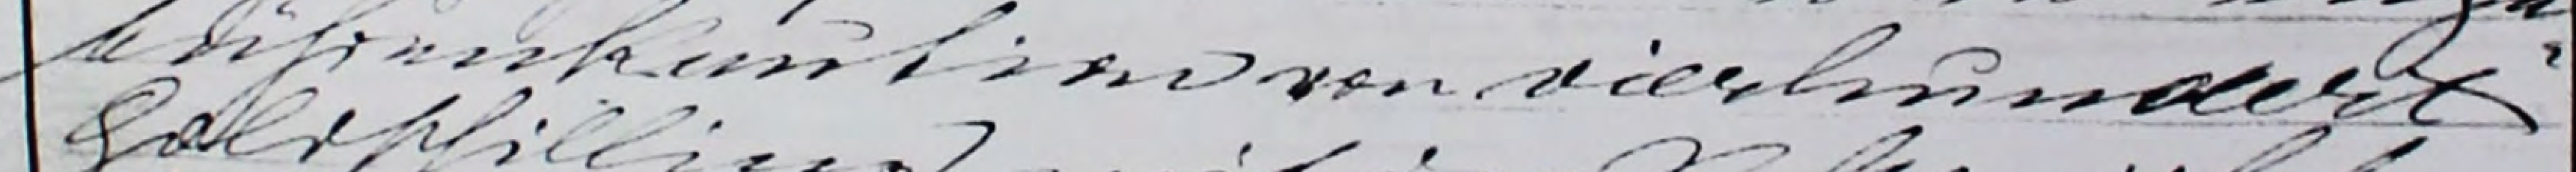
bührenkaution von vierhundert
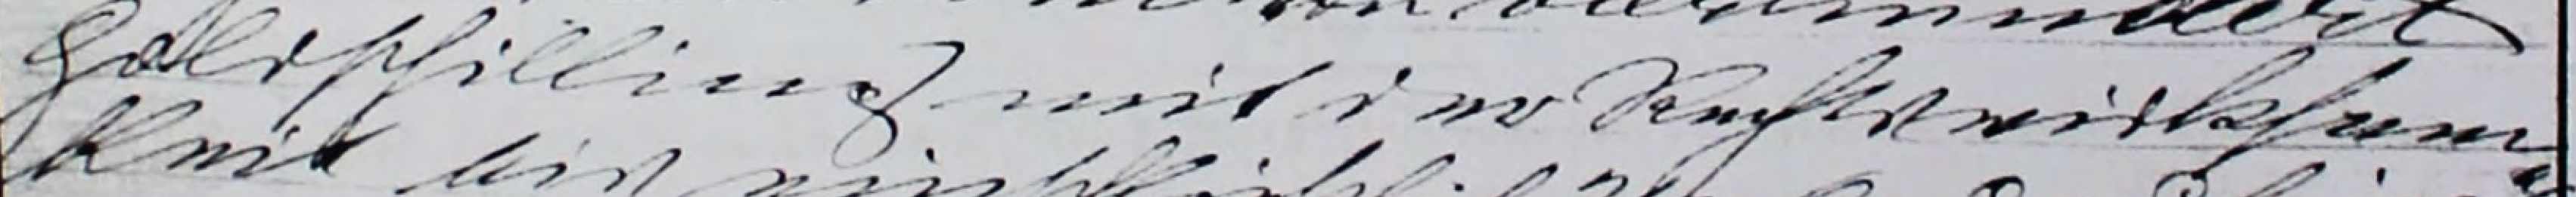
Goldschilling mit der Rechtswirksam„
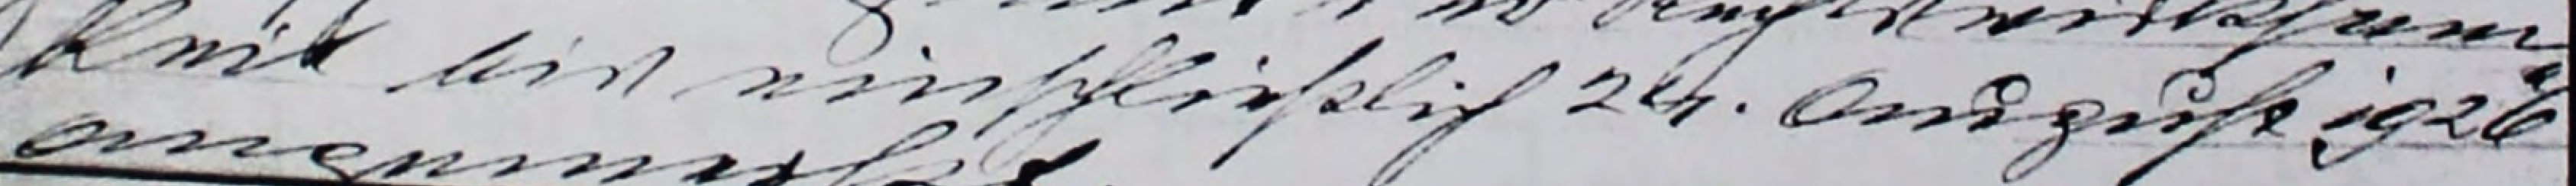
keit bis einschließlich 24. August 1926
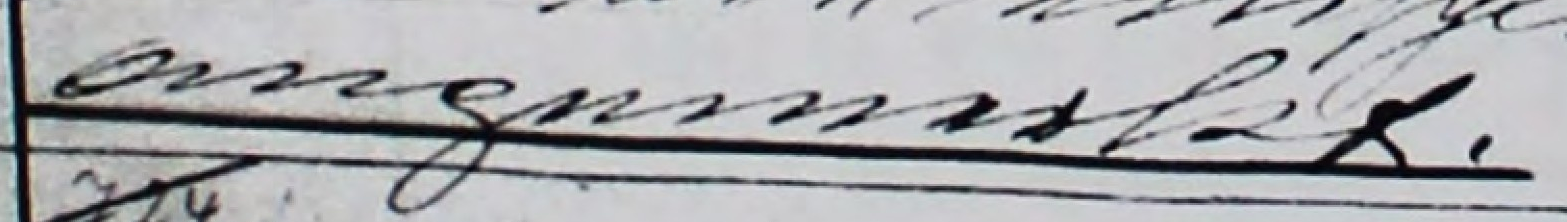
angemerkt.
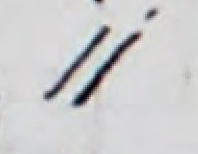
11
